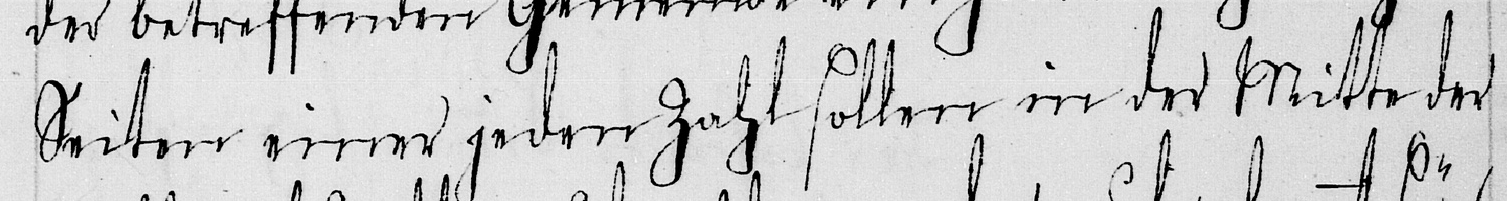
Seiten einer jeden Zahl sollen in der Mitte der
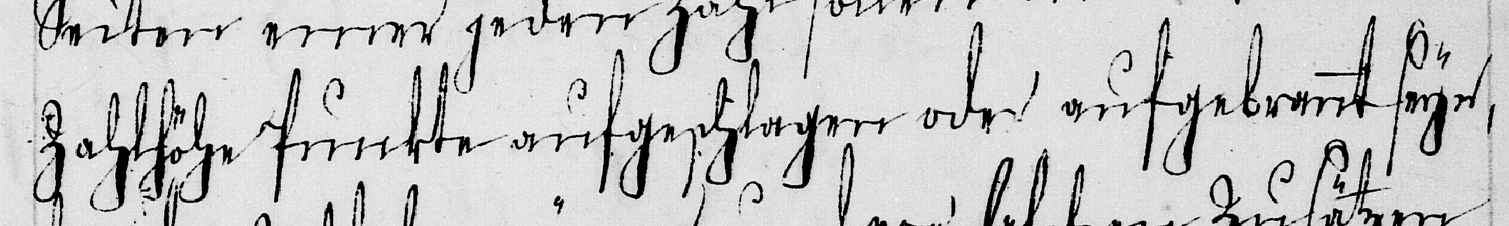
Zahlhöhe Punkte aufgeschlagen oder aufgebrannt seyn,
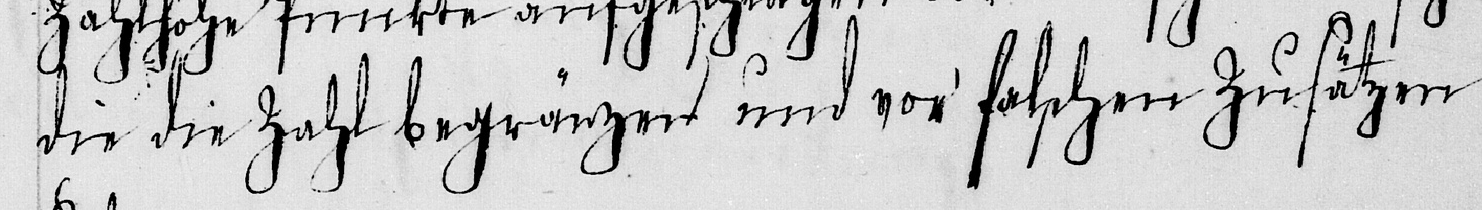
die die Zahl begränzen und vor falschen Zusätzen
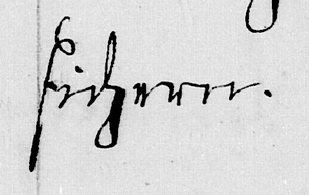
sichern.
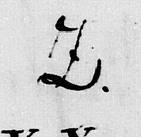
Z.
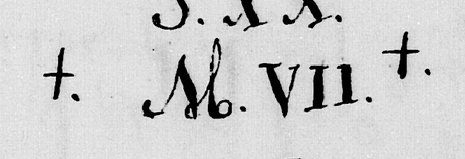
+. M. VII. +.
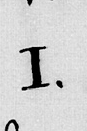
I.
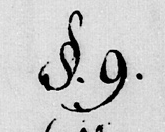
§. 9.
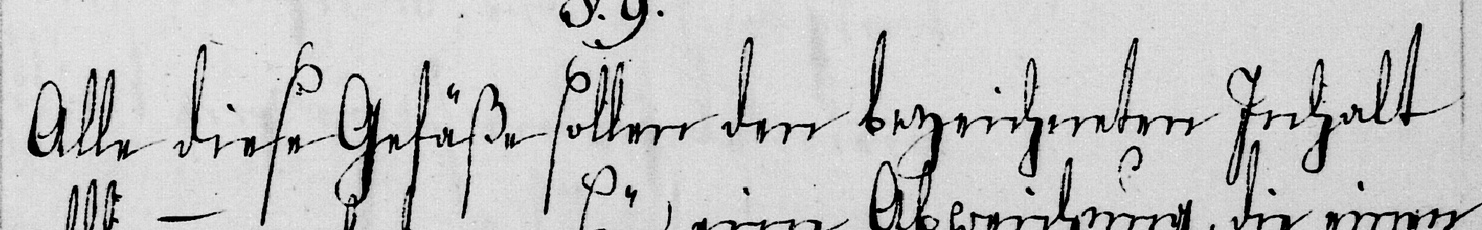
Alle diese Gefäße sollen den bezeichneten Inhalt
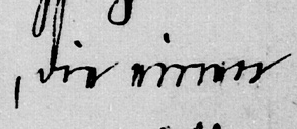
die einen
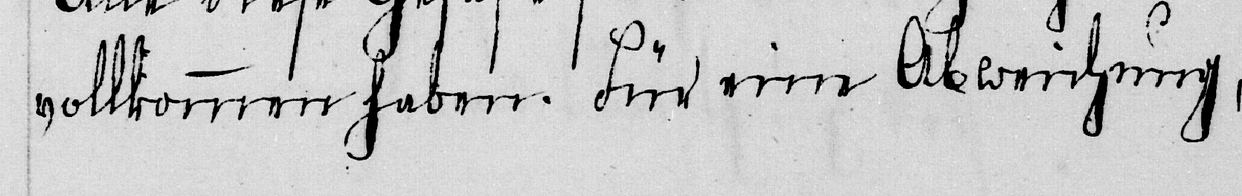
vollkommen haben. Für eine Abweichung,
